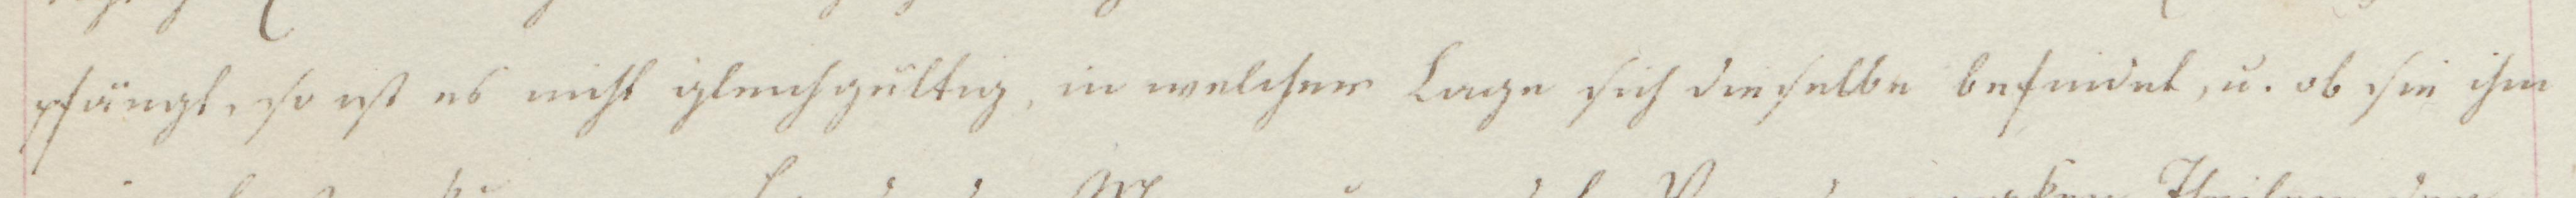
pfängt, so ist es nicht gleichgültig, in welcher Lage sich dieselbe befindet, u. ob sie ihm
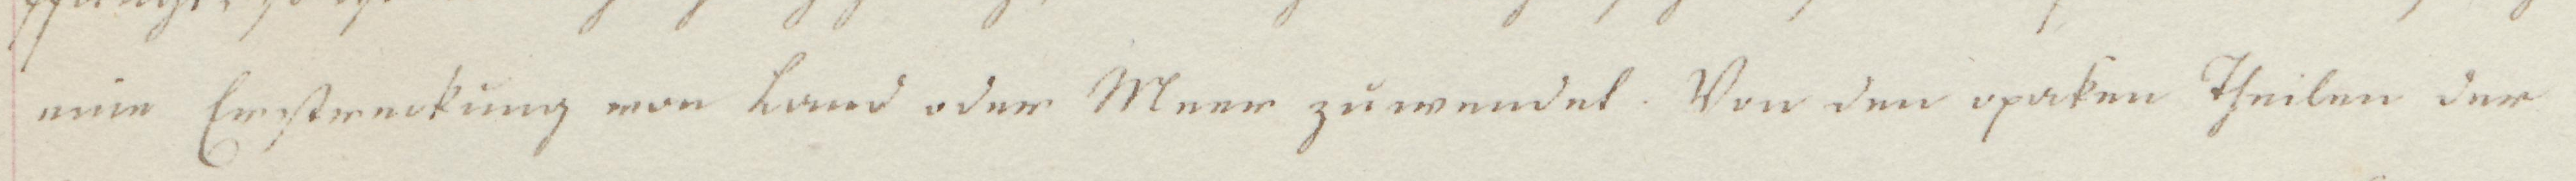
eine Erstreckung von Land oder Meer zuwendet. Von den opaken Theilen der
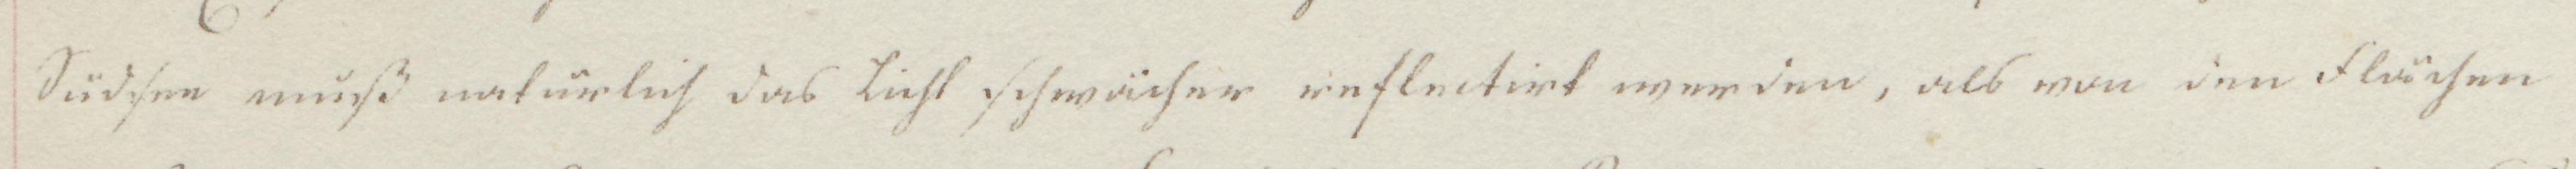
Südsee muß natürlich das Licht schwächer reflectirt werden, als von den Flächen
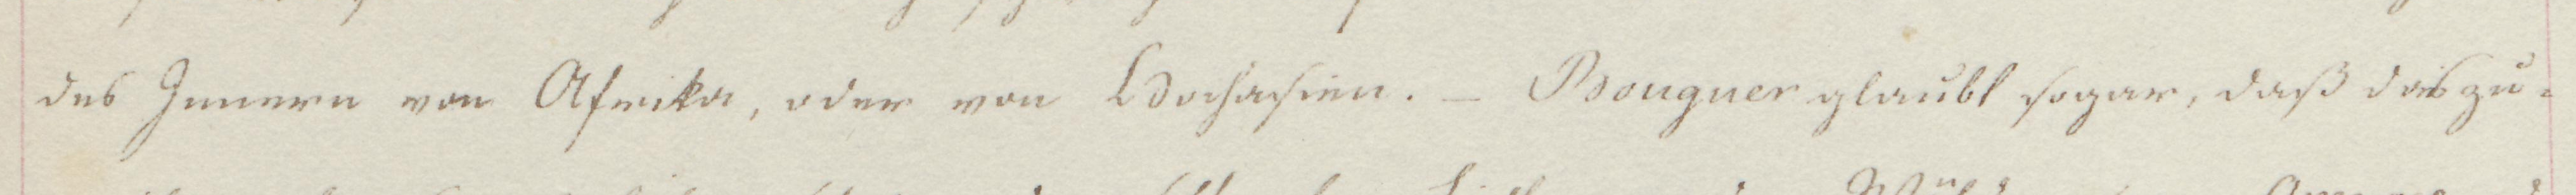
des Innern von Afrika, oder von Hochasien. – Bouguer glaubt sogar, daß das zu-
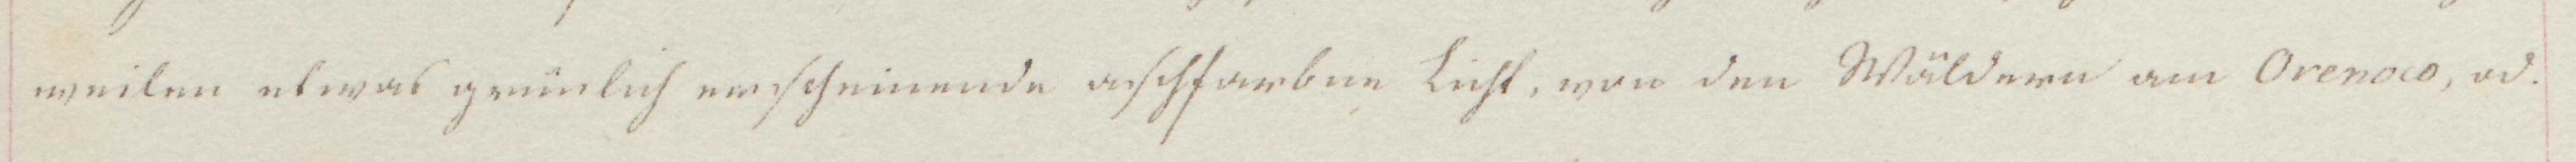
weilen etwas grünlich erscheinende aschfarbne Licht von den Wäldern am Orenoco, od.
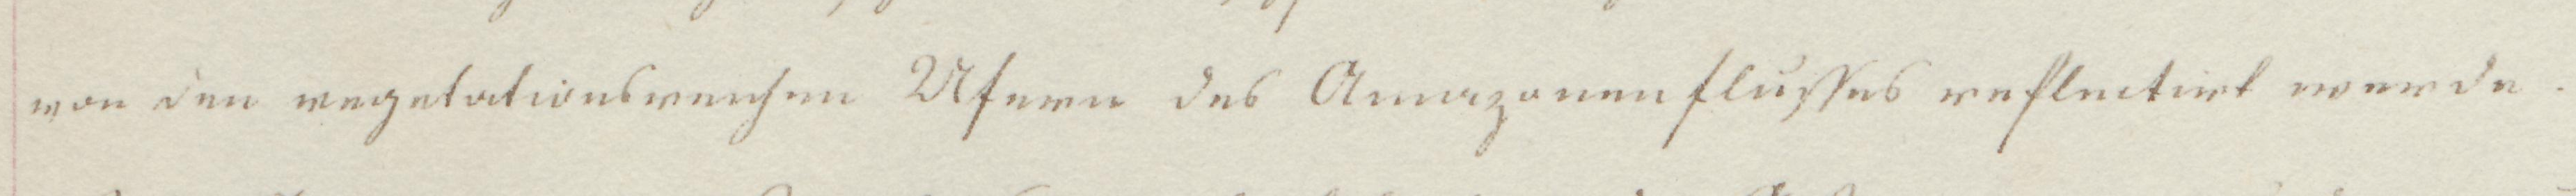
von den vegetationsreichen Ufern des Amazonenflusses reflectirt wurde.
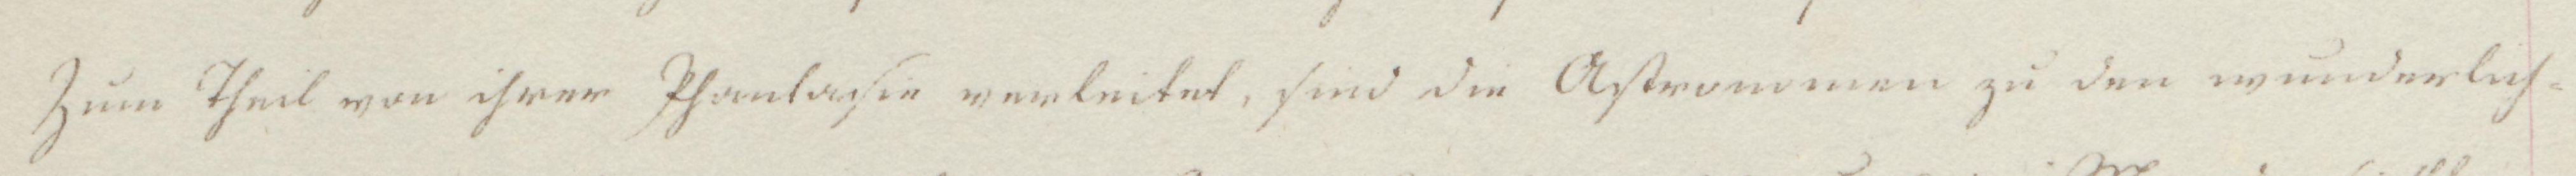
Zum Theil von ihrer Phantasie verleitet, sind die Astronomen zu den wunderlich-
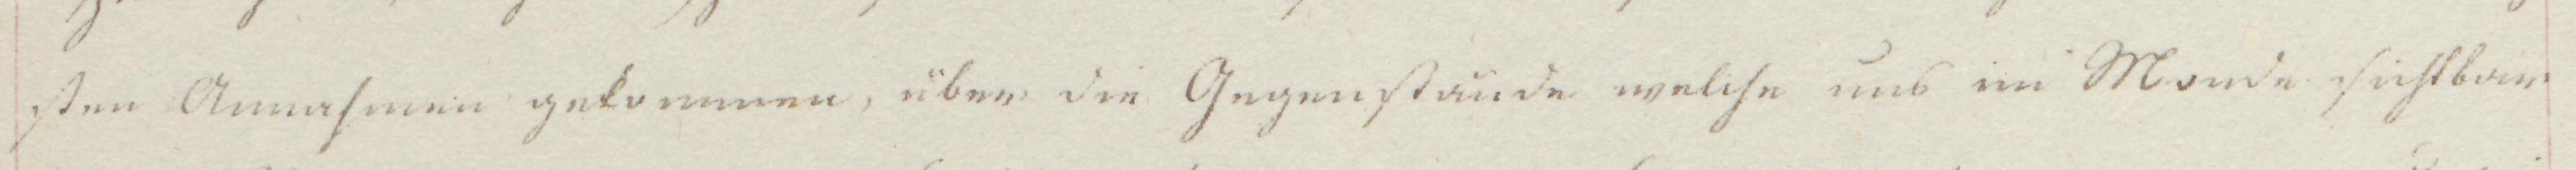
sten Annahmen gekommen, über die Gegenstände welche uns im Monde sichtbar
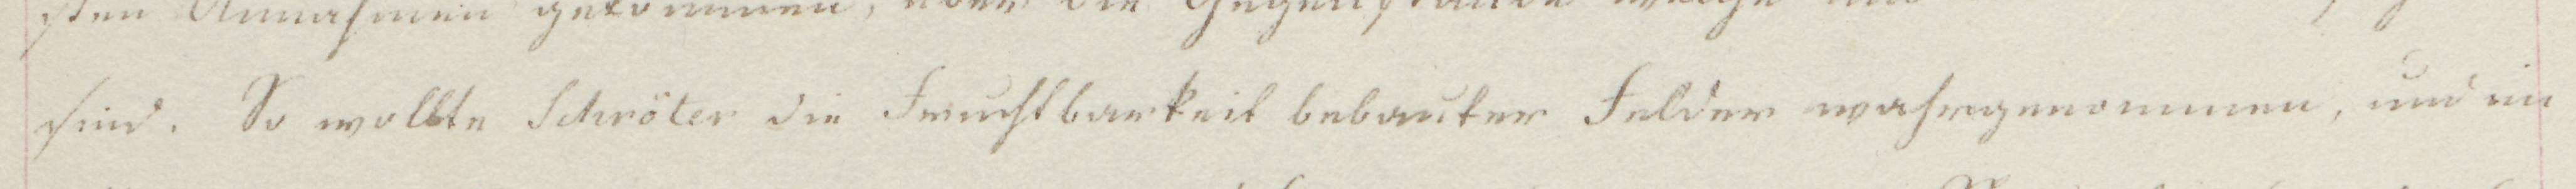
sind. So wollte Schröter die Fruchtbarkeit bebauter Felder wahrgenommen, und im
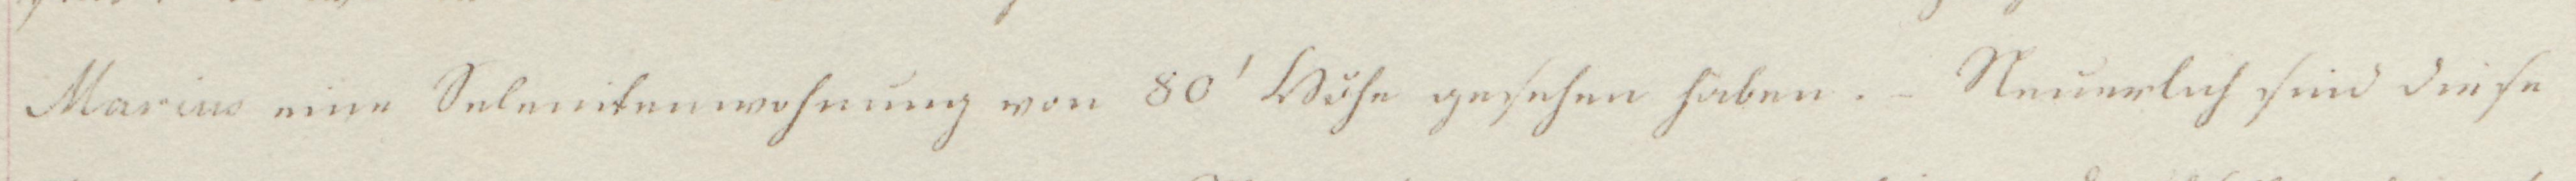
Marius eine Selenitenwohnung von 80′ Höhe gesehen haben. – Neuerlich sind diese
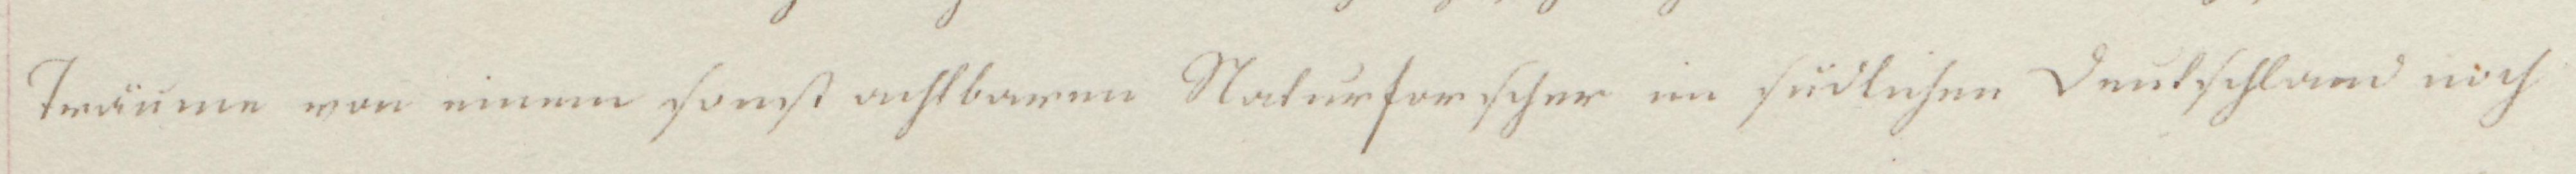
Träume von einem sonst achtbaren Naturforscher im südlichen Deutschland noch
